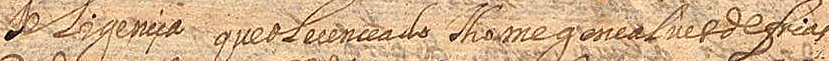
DeLigençia que o Lecenceado Thome goncalues de frias
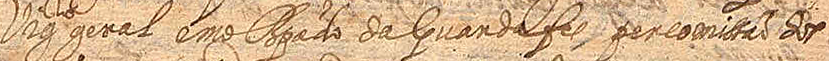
Virgro geral em o Bpādo da Guarda fes per comissaõ dos
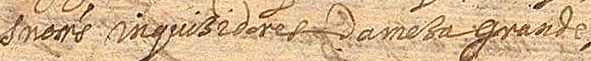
snors̄ inquizidores da meza grande
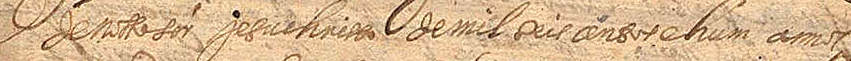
de nosso sor̄ jesu christo de mil seiscentos e hum annos
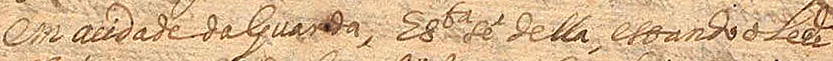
em a çidade da Guarda, E sta sê della, estando o Lecedo
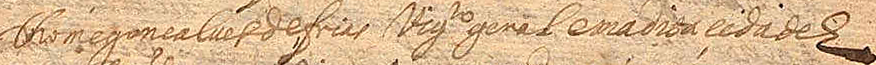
thome goncalues de frias Vigro geral em a dita çidade E
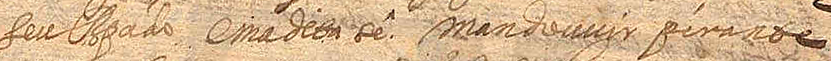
seu Bpādo em a dita sê. mandou uir perante
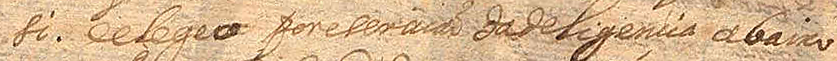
si. e elegeo por escriuaõ da deligençia abaixo
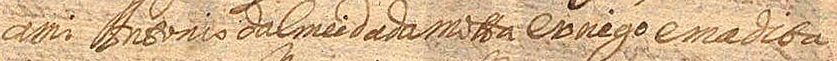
a mi Antonio dalmeida da motta conigo em a dita
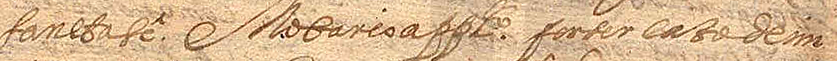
sancta sê. e Notario applco. por ser cazo de im
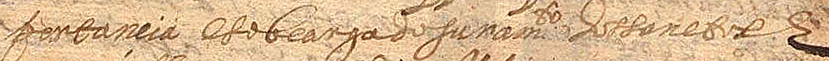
portançia e sob cargo do juramto dos sanctos E
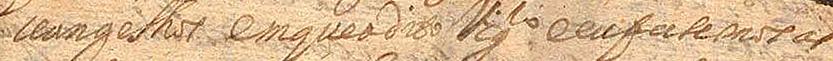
uangelhos em que o dito Vigro e eu pusemos as
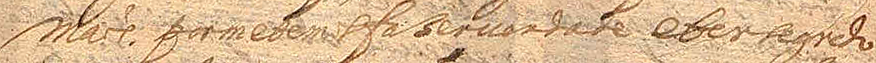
maõs pormetemos fazer uerdade e ter segredo
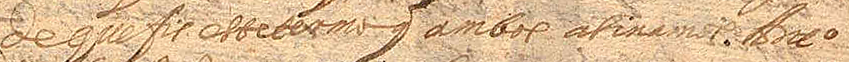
de que fis deste termo q̄ ambos asinamos. Anto
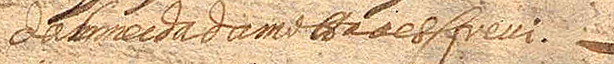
dalmeida da motta o escreui.
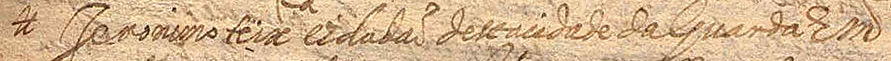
item Jeronimo teixra çidadaõ desta çidade da Guarda E mro
